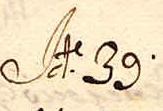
Id̄.e 39.
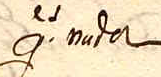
g.es nada
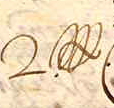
2.tto.
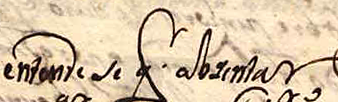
entende se q̄. abzentar
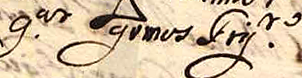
g.ar gomes Fig.ro
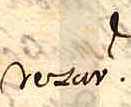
rezar.
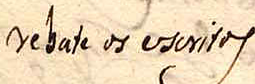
rebate os escritos
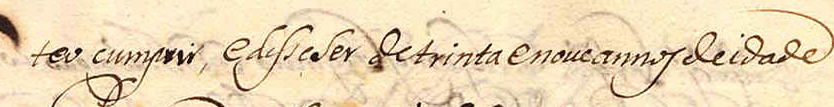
teo cumprir, e disse ser de trinta e noue annos de idade
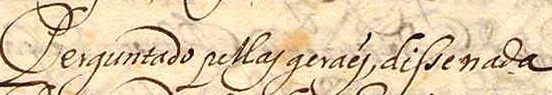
Perguntado pellas geraes, disse nada
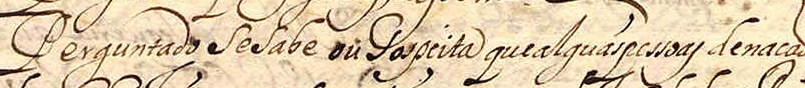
Perguntado se sabe ou sospeita que alguās pessoas de naçaõ
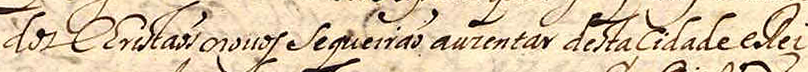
dos Christaõs nouos se queiraõ auzentar desta cidade e Rei
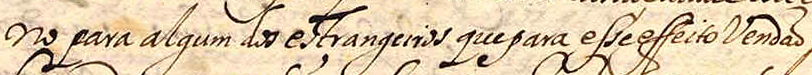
no para algum dos estrangeiros que para esse effeito Vendaõ
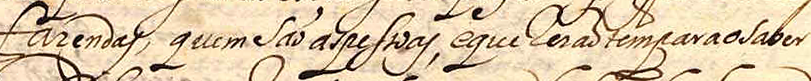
fazendas, quem saõ as pessoas, e que Rezaõ tem para o saber
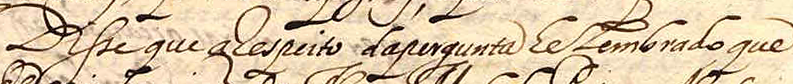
Disse que a Respeito da pergunta he lembrado que
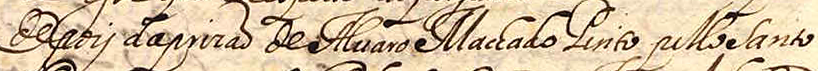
depois da prizaõ de Aluaro Machado Pinto pello Santo
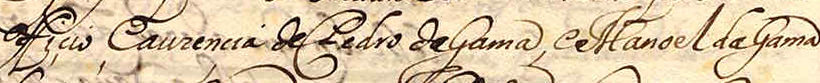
offiçio, e auzencia de Pedro da Gama, e Manoel da Gama
